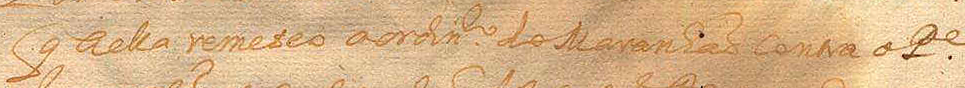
q̄ a ella remeteo o ordinro do Maranhaõ contra o P.e
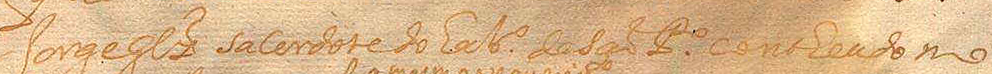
Jorge glz̄ sacerdote do hab.o de Saõ P.o contheudo no
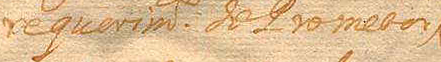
requerim.to do Prometor
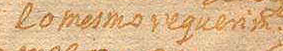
e o mesmo requerimto
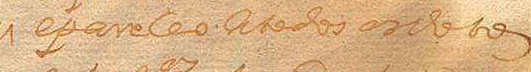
e pareceo a todos os votos
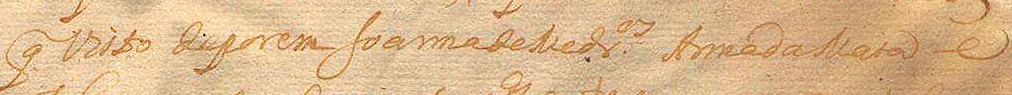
q̄ visto deporem Joanna de Medr.os Anna da Mata e
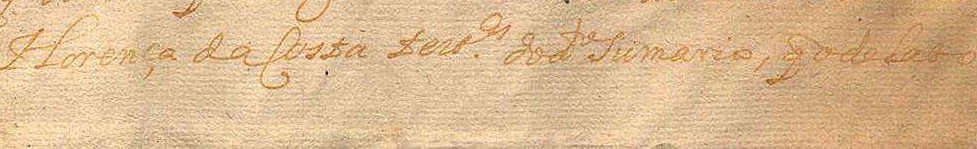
Florença da Costa test.as do d̄o Sumario, q̄ o delato
